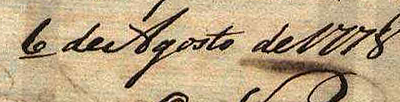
6 de Agosto de 1778
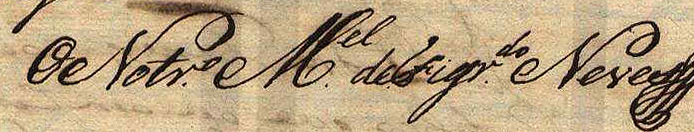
O Notr.o M.el de Figr.do Neves
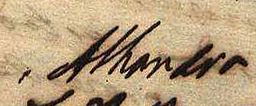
Alhandra
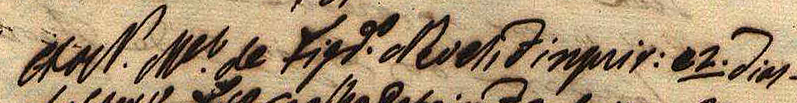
ao N. M.el de Figr.o Neves, d̄ inquir: 02. dias - i720
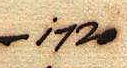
- i720
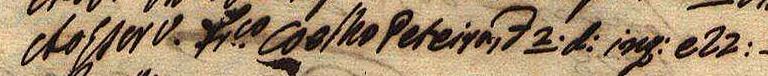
Ao Escrv. Fr.co coelho Peteira, d̄ 2. d: inq: e22:
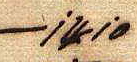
i4i0
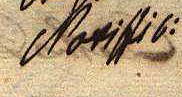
Notiffic:
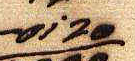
0i20
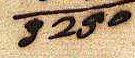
3250
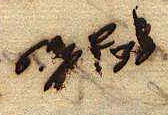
6.a p.e 30
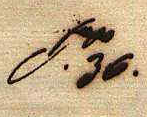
.36.
